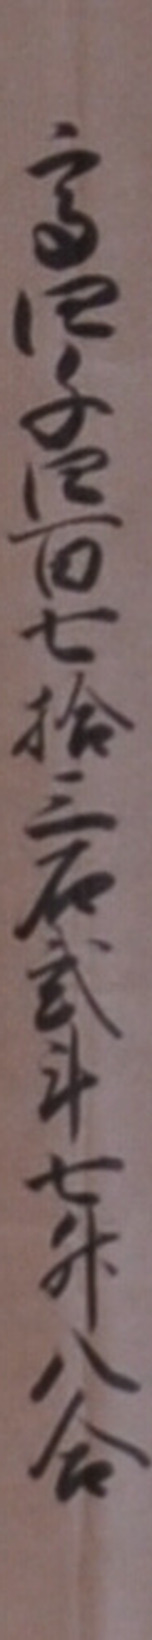高四千四百七拾三石弐斗七升八合
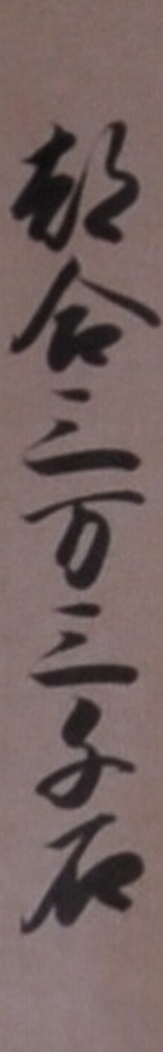都合三万三千石
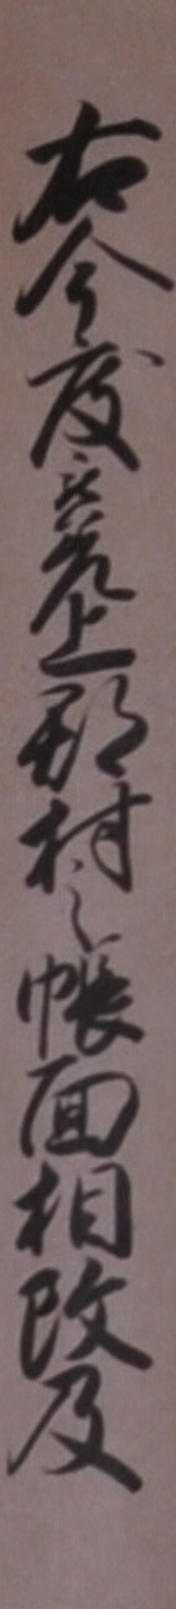右今度被差上郡村之帳面相改及
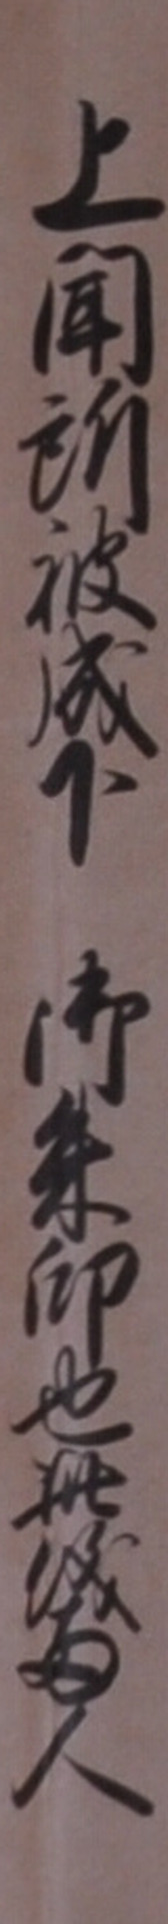上聞所被成下御朱印也此儀両人
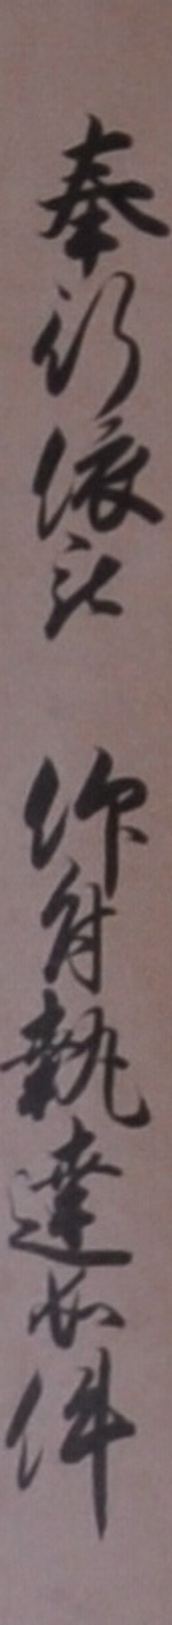奉行依被仰付執達如件
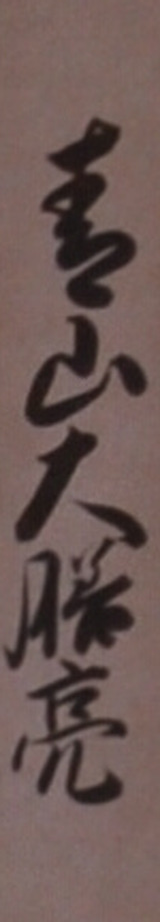青山大膳亮
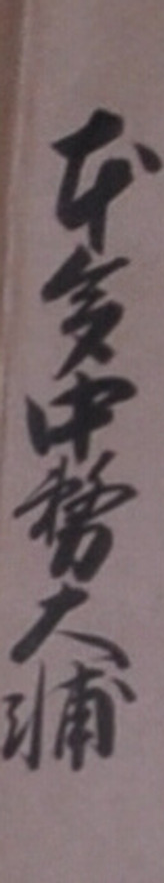本多中務大輔
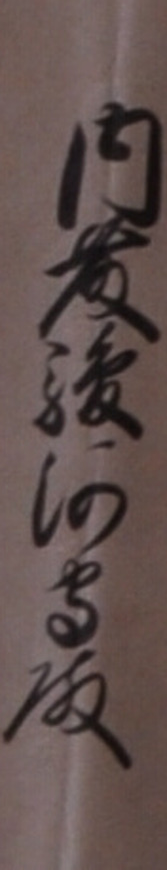内藤駿河守殿

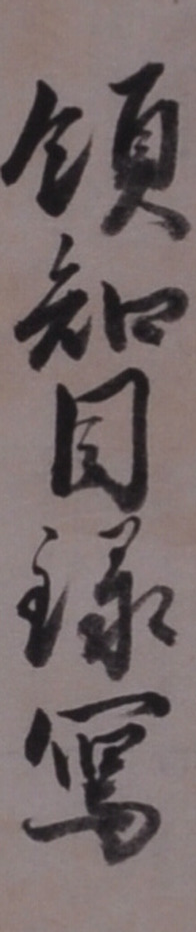領知目録写

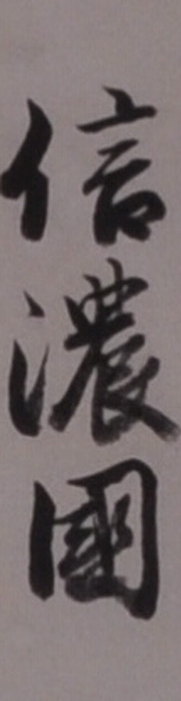信濃国
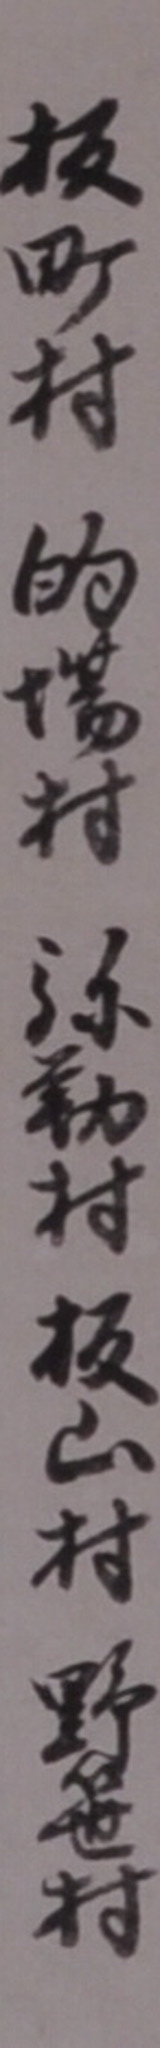板町村的場村弥勒村板山村野笹村
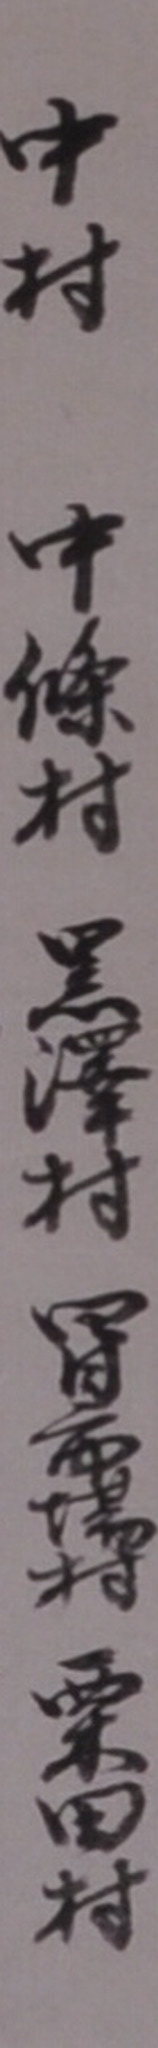中村中条村黒沢村四日市場村栗田村
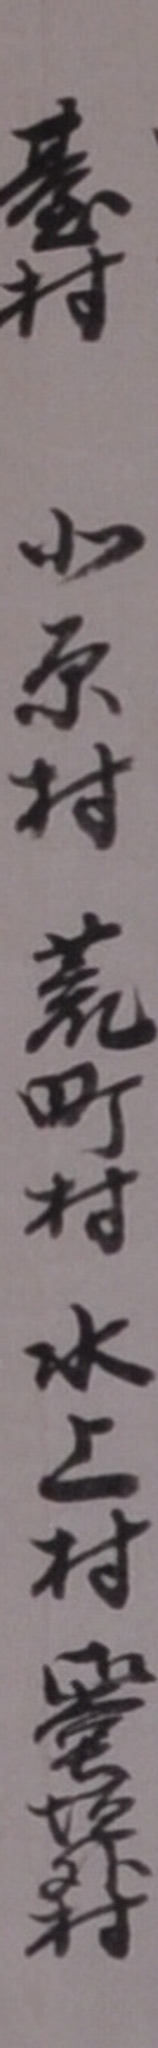台村小原村荒町村水上村御堂垣外村
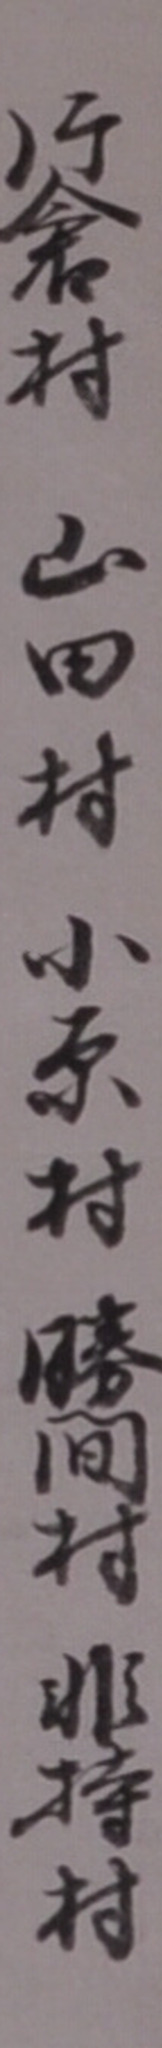片倉村山田村小原村勝間村非持村
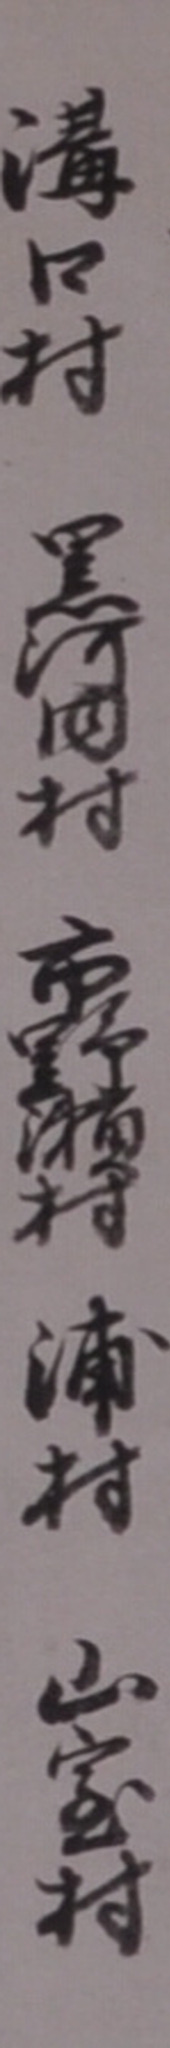溝口村黒河内村市野瀬村浦村山室村
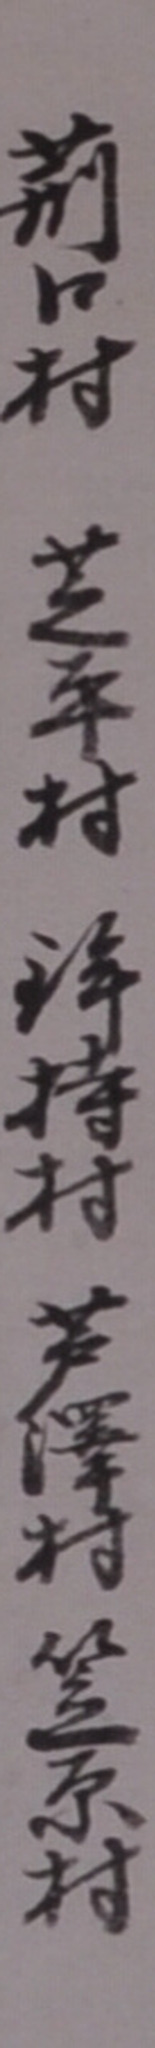荊口村芝平村鉾持村芦沢村笠原村
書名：御朱印写・領地目録
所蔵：伊那市立高遠町図書館・合同会社AMANE
